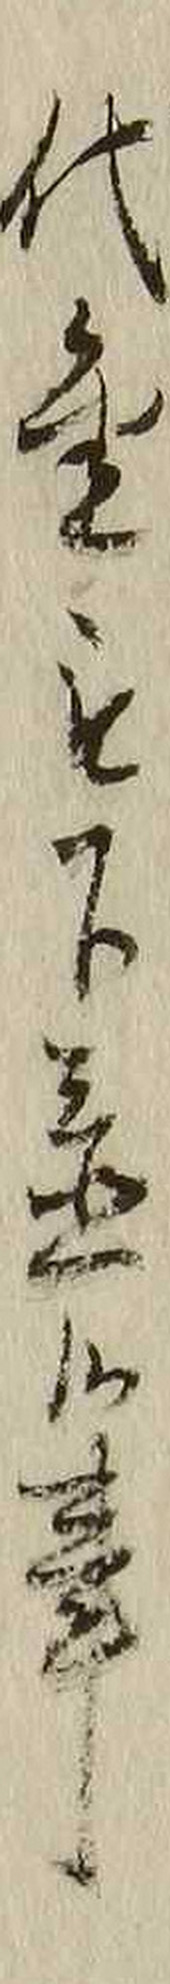代金被下置候事
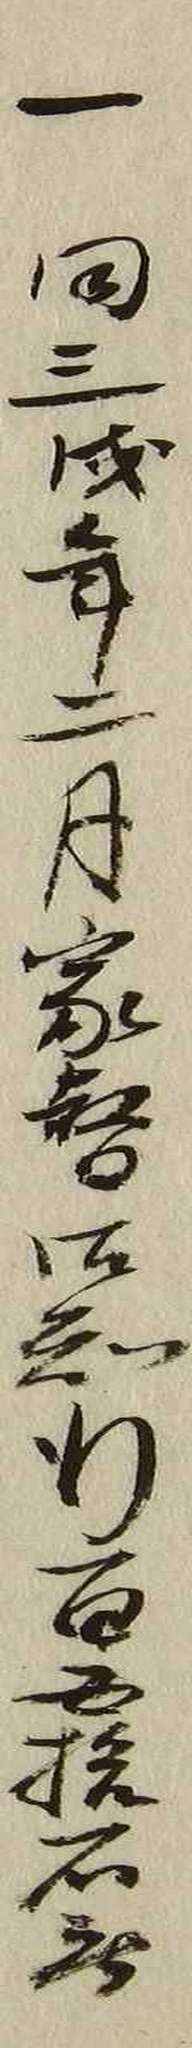一同三戌年二月家督御知行百五拾石無
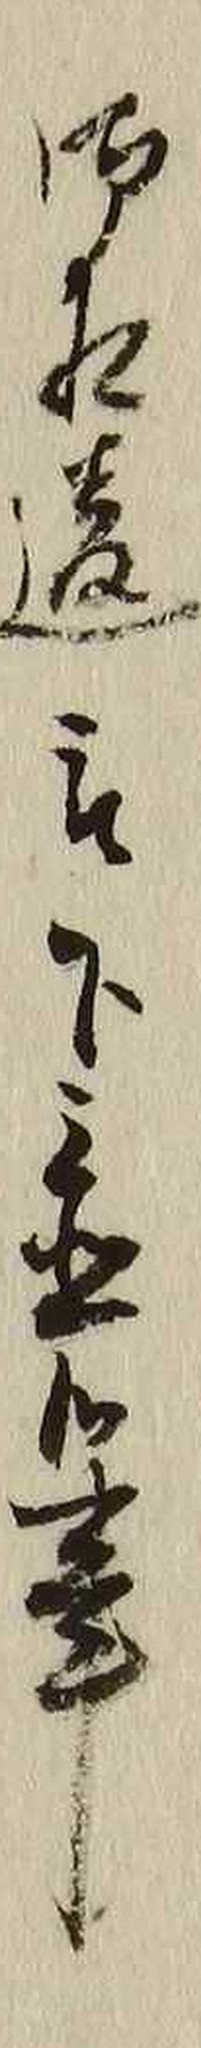御相違被下置候事
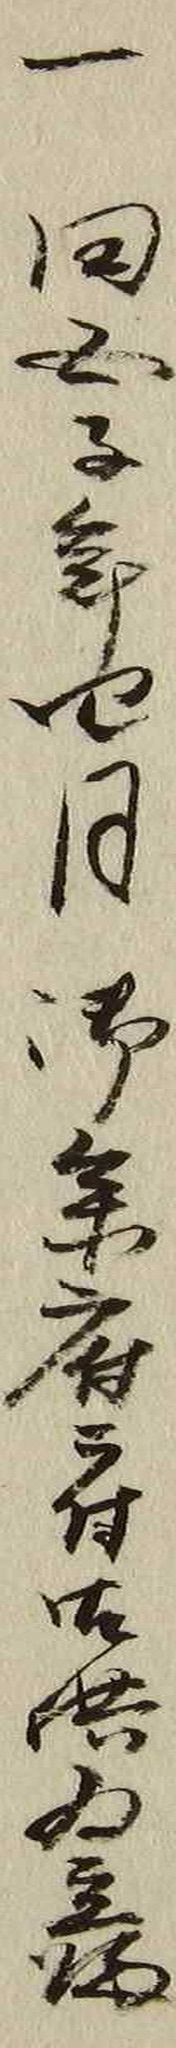一同五子年四月御参府ニ付御供為立帰
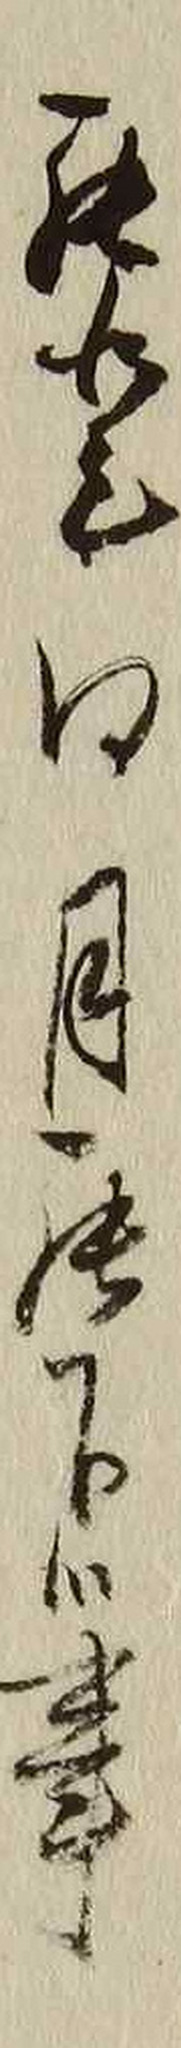罷登同四月罷下候事
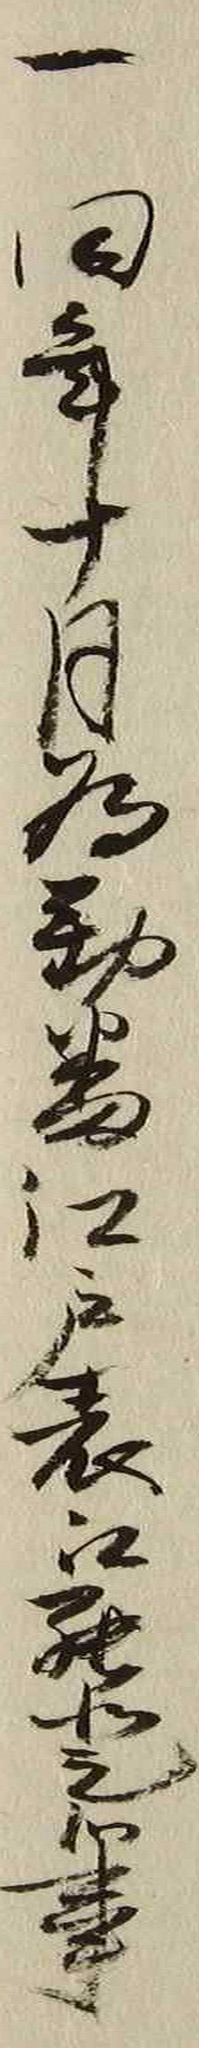一同年十月為勤番江戸表江罷登候事
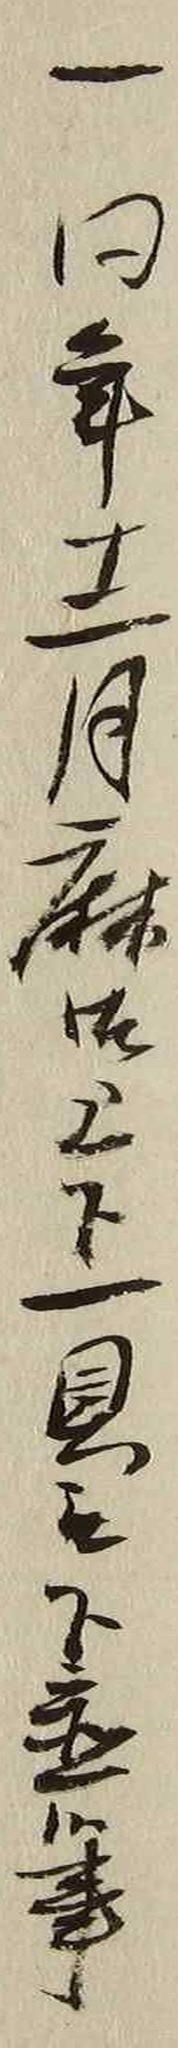一同年十二月麻御上下一具被下置候事
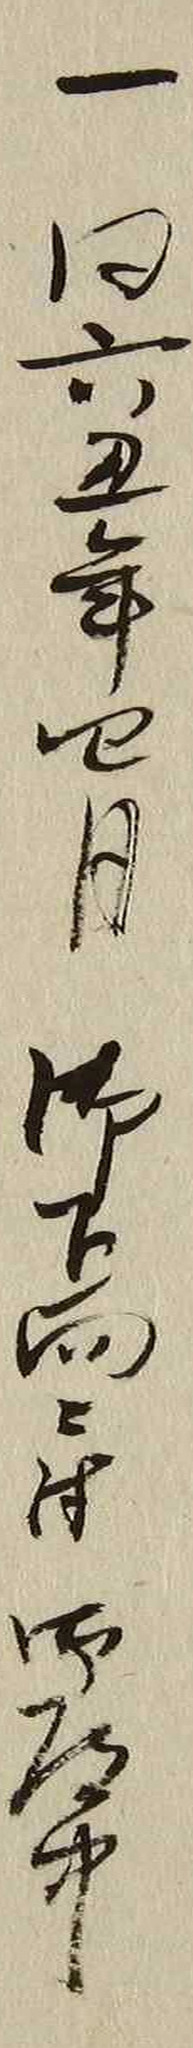一同六丑年四月御下向ニ付御道中
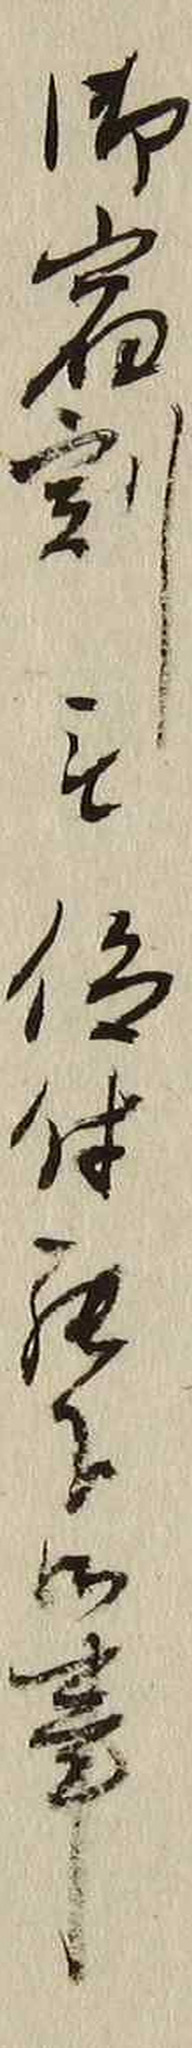御宿割被仰付罷下候事
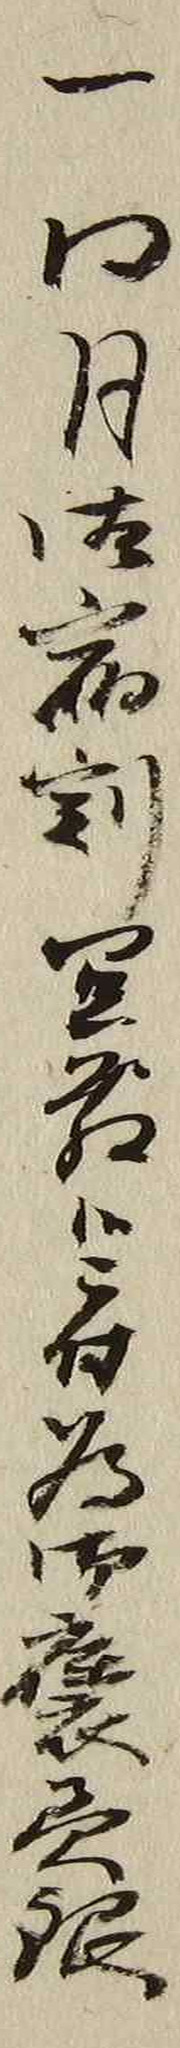一同月御宿割宜敷候ニ付為御褒美銀
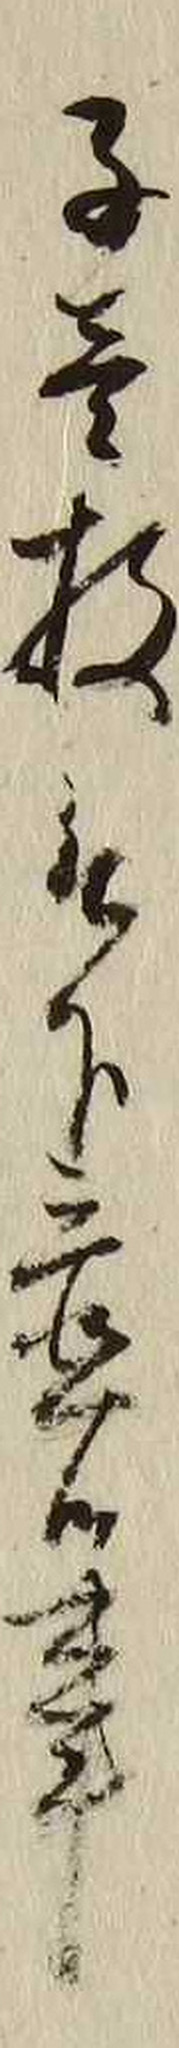子壱枚被下置候事
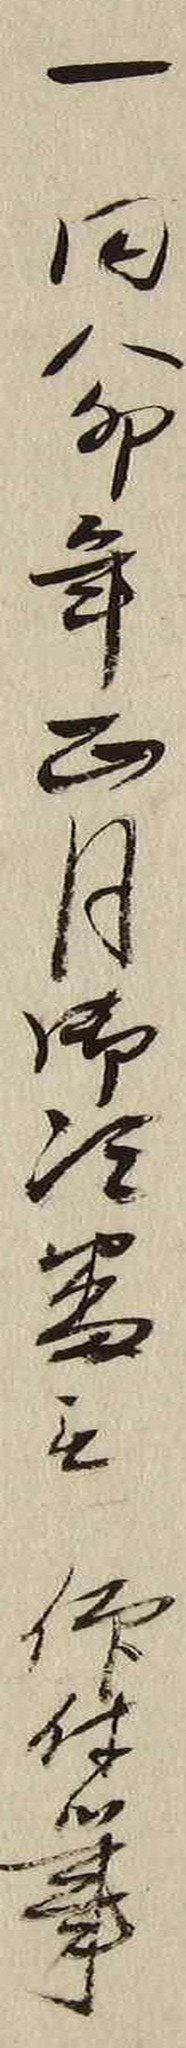一同八卯年正月御次番被仰付候筆
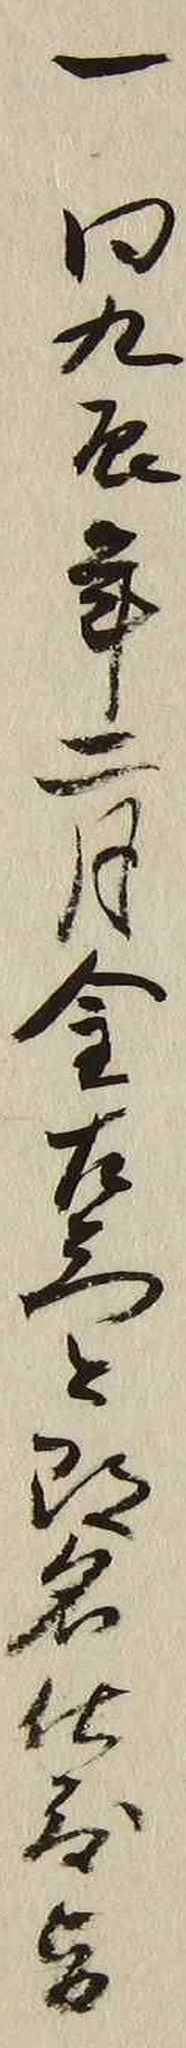一同九辰年二月金左衛門と改名仕度旨
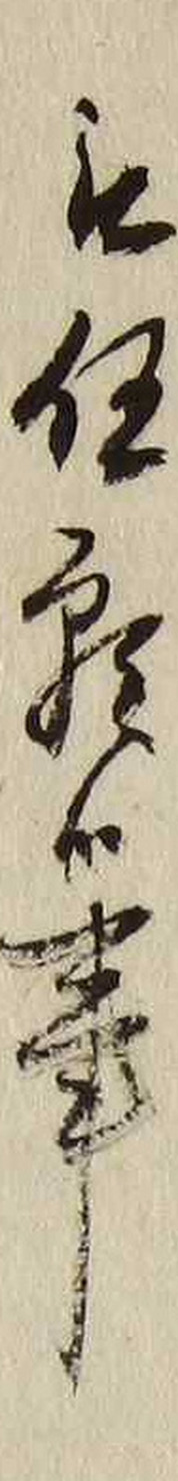被任願候事
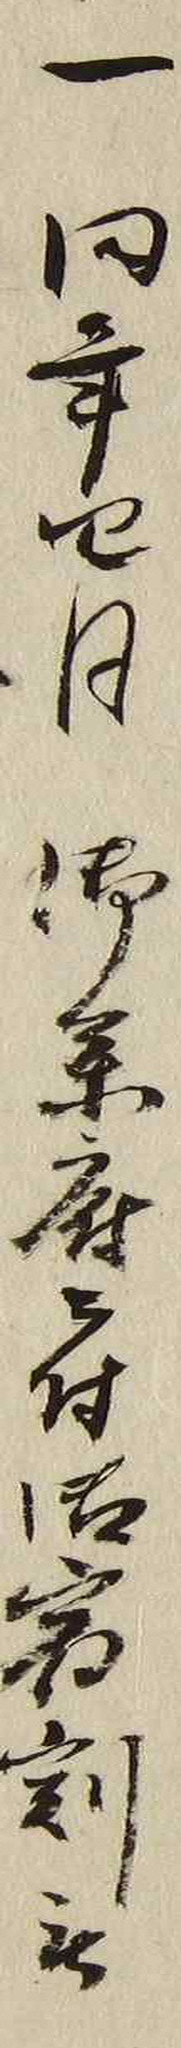一同年四月御参府ニ付御宿割被
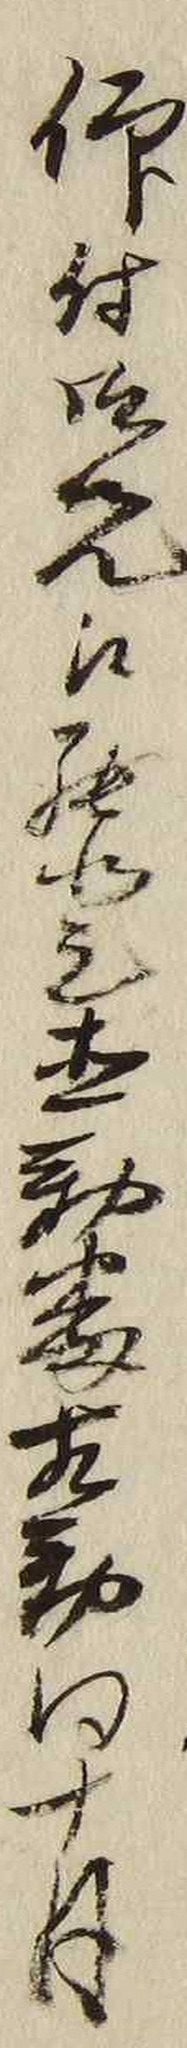仰付御先江罷登直勤番相勤同十月
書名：諸士系譜　巻之345　も之部1
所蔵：会津若松市立会津図書館
